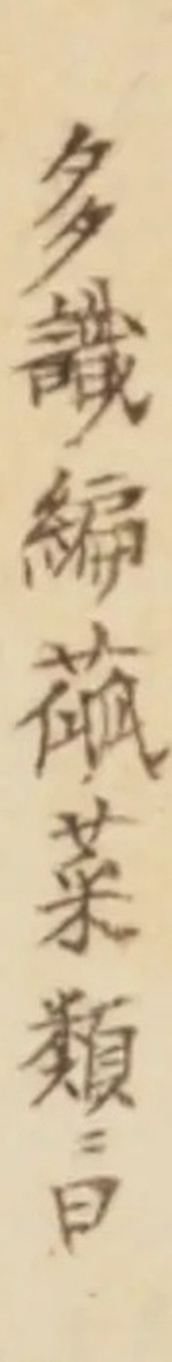多識編蓏菜類ニ曰
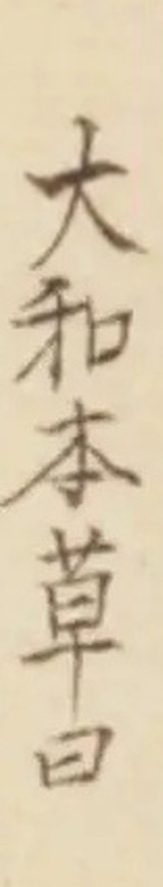大和本草曰
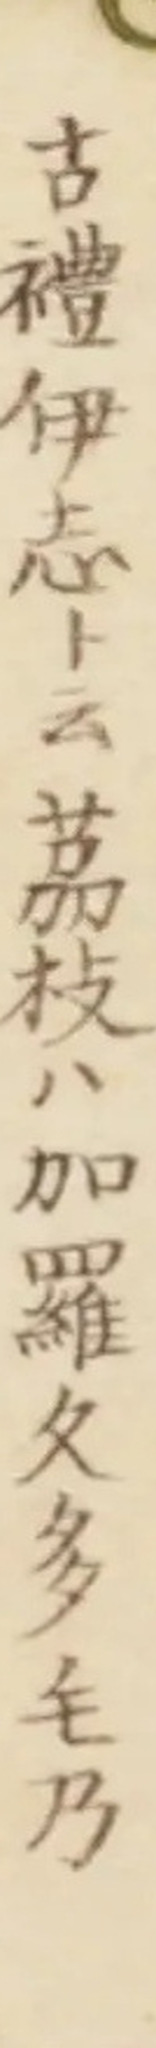古禮伊志と云茘枝は加羅久多毛乃

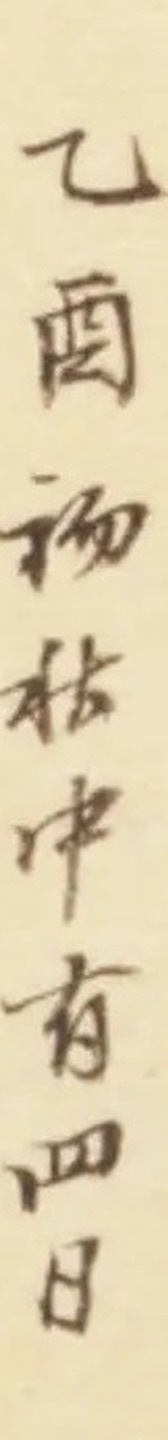乙酉初秋中有四日

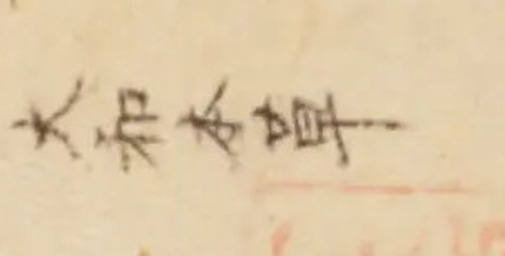大和本草
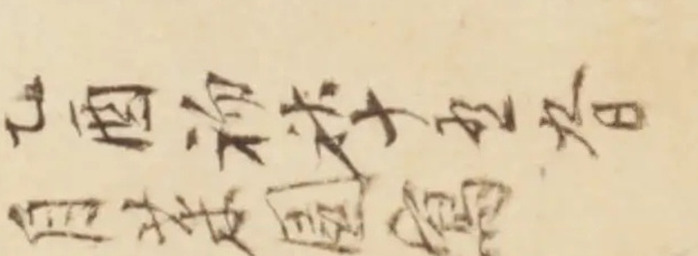乙酉初秋十有九日於
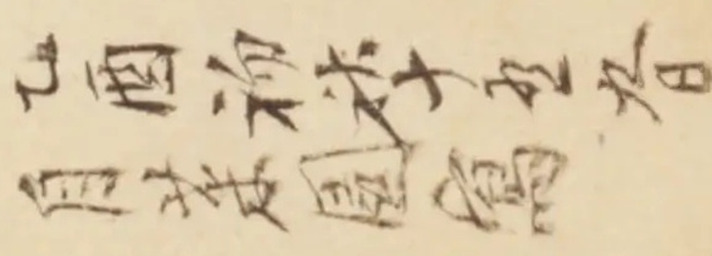乙酉初秋十有九日於

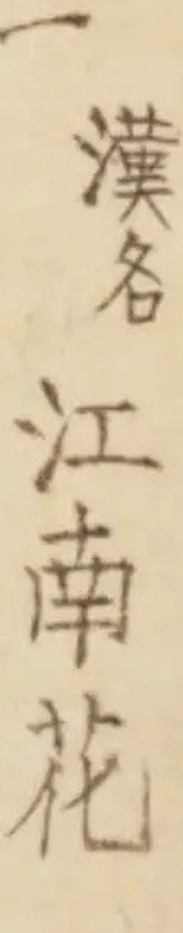漢名江南花
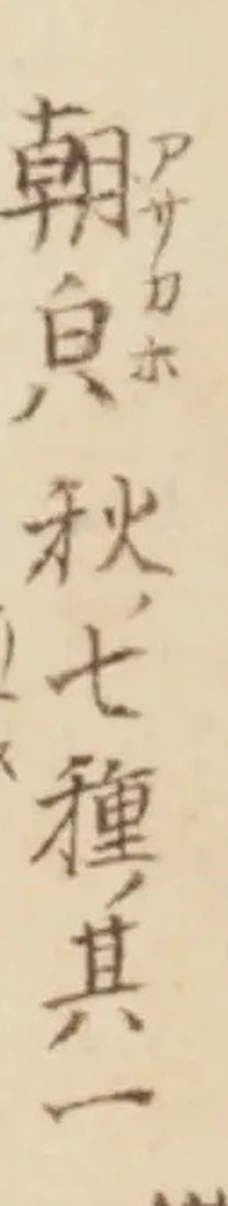朝皃秋の七種の其一
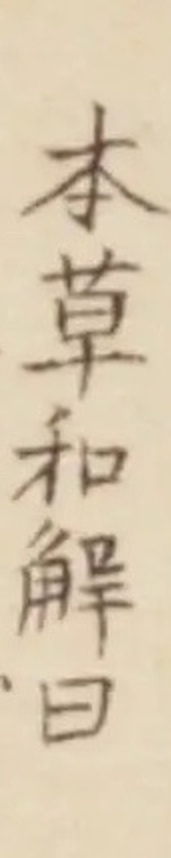本草和解曰
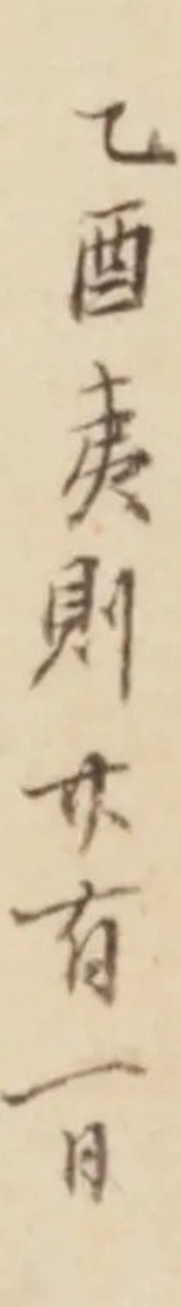乙酉夷則廿有一日
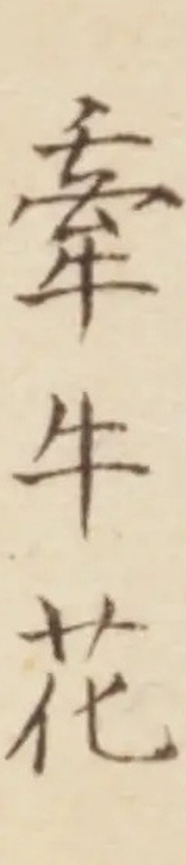牽牛花
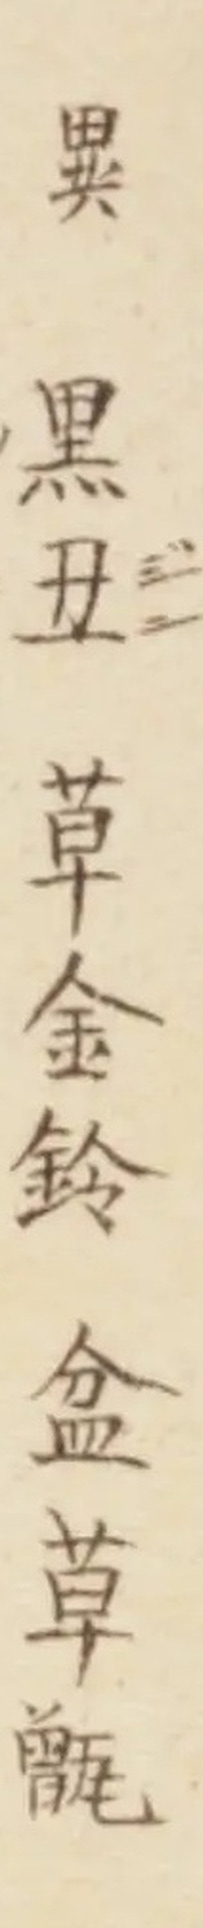異黒丑草金鈴盆草甑
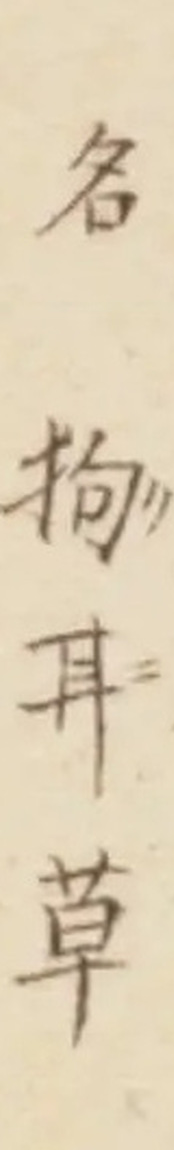名狗耳草
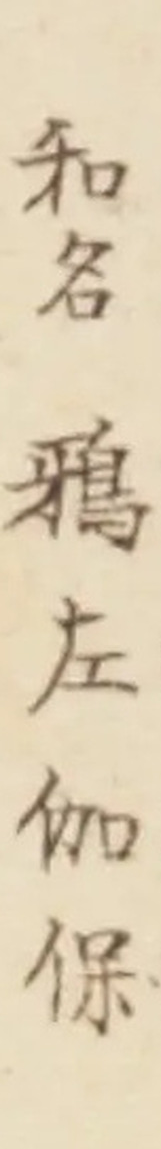和名鴉左伽保
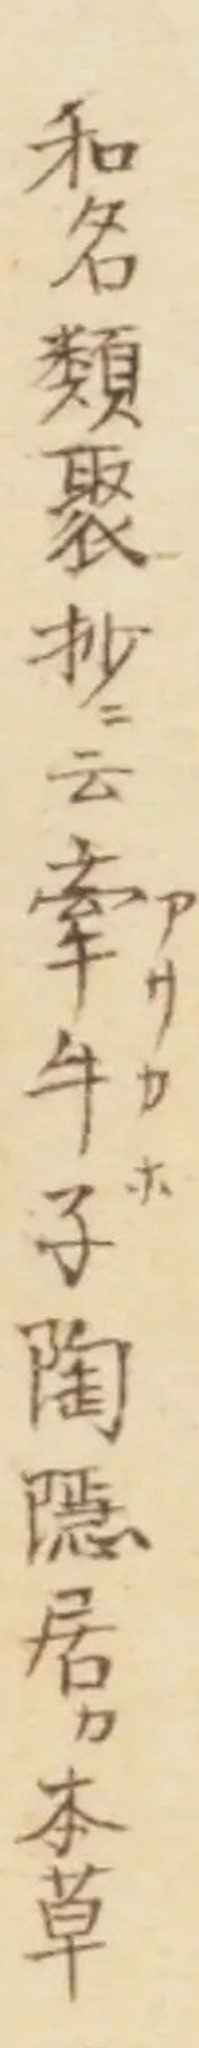和名類聚抄に云牽牛子陶隠居か本草
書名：梅園草木花譜秋之部. 3
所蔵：国立国会図書館 National Diet Library, JAPAN
